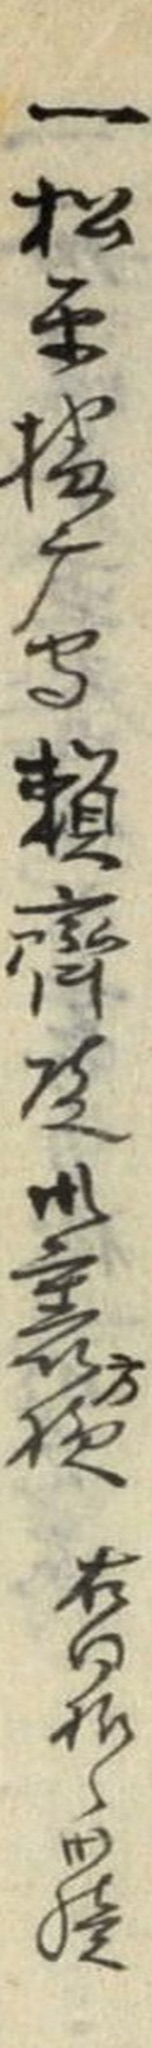一松平播磨守頼齊殿御裏方様右同様之御続
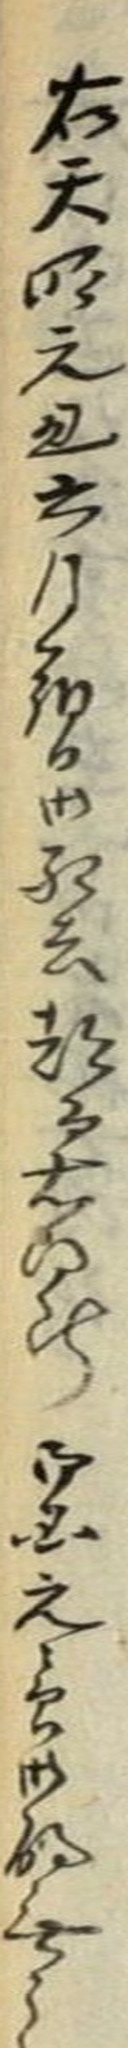右天明元丑六月朔日御死去都て右同断御国元にては御触無之
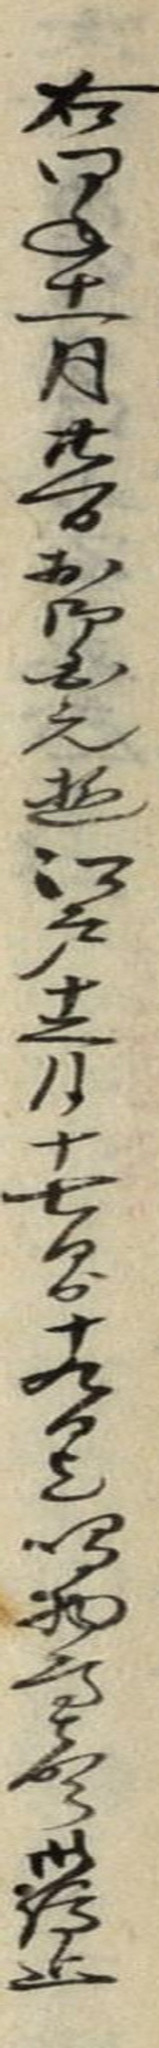右同年十一月廿一日於御国元逝江戸十二月十七日ゟ十九日迄鳴物高声御停止
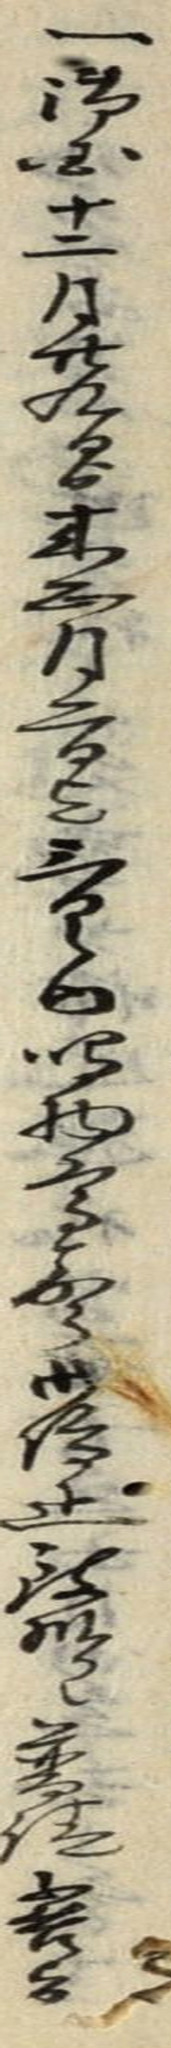一御国十二月廿九日ゟ来正月二日迄三日之内鳴物高声御停止致掛り候普請不苦旨
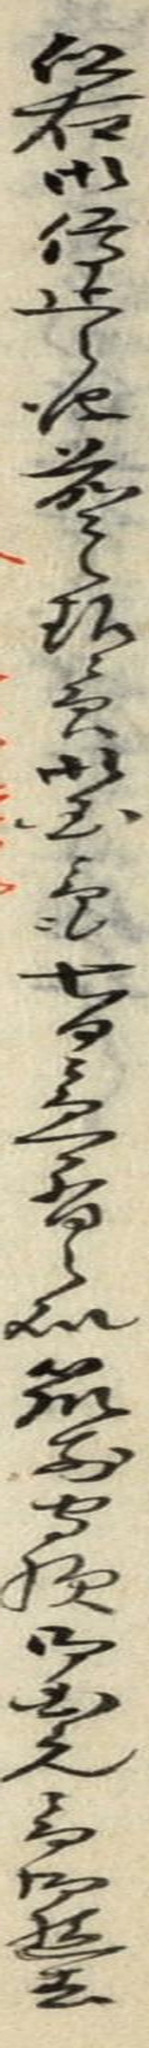但右御停止之儀前々之趣にては御国にても七日にて可有之処筑前守様御国元にて御逝去
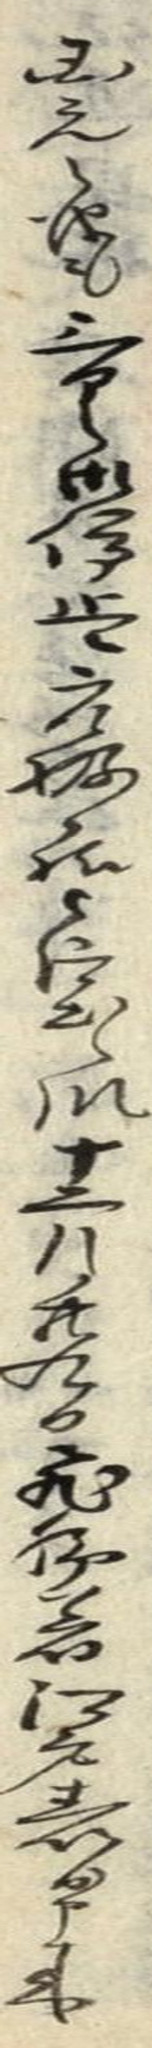国元之儀も三日之御停止に取扱候様被仰出候段十二月廿九日飛脚着江戸表ゟ申来
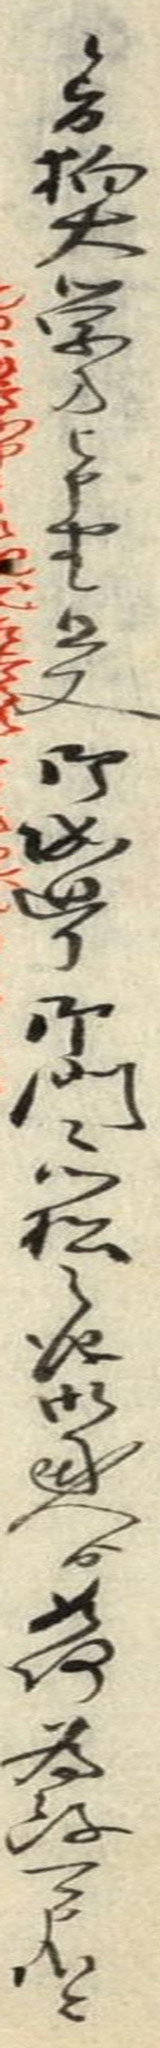候旨狛大学方被申聞候且又御城廻り御門々門松之儀御用人ゟ如何為致可申哉と
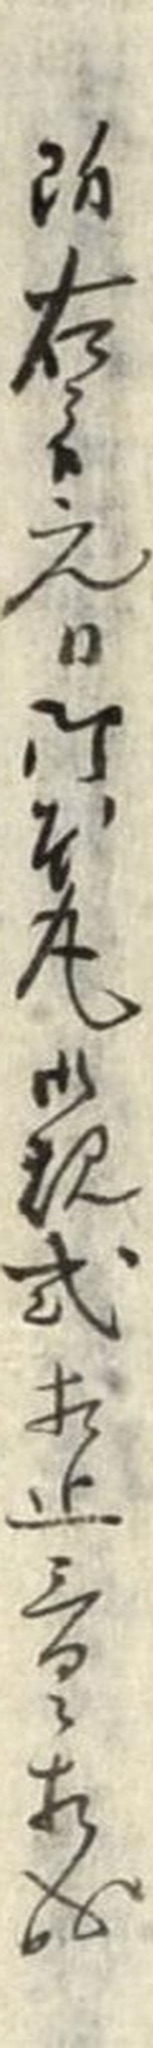附右に付元日御本丸御規式相止三日に相成
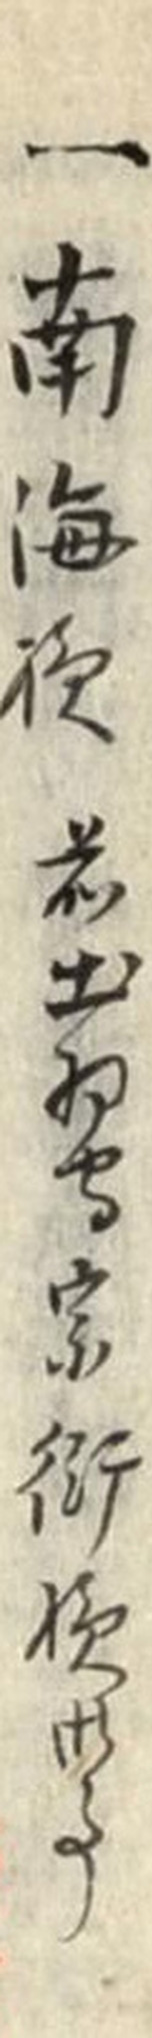一南海様前出羽守宗衍様御事
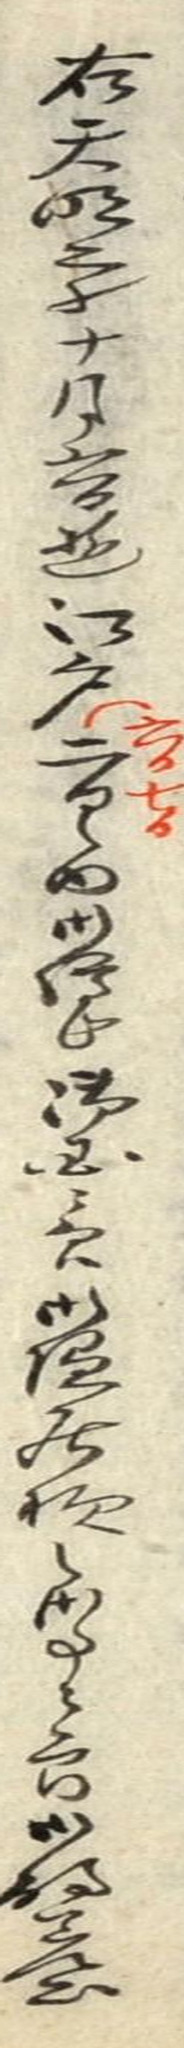右天明二刁十月六日逝江戸六日七日二日之内御停止御国にては御隠居様之御事に候間御触差出
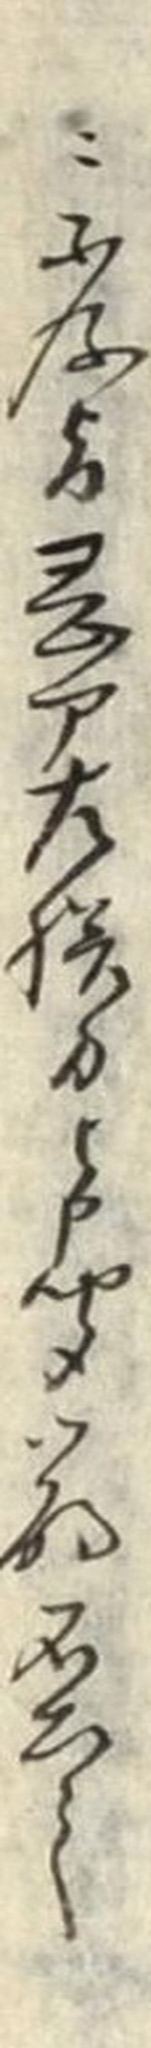に不及旨岡部左膳方被申聞御触不出之
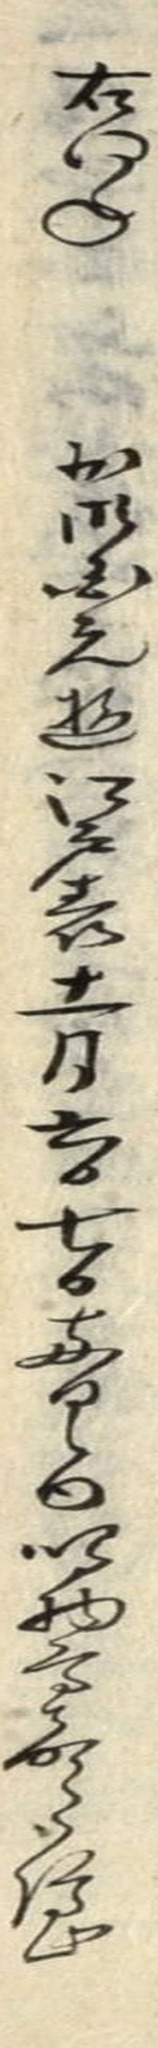右同年於御国元逝江戸表十一月六日七日両日之内鳴物高声御停止

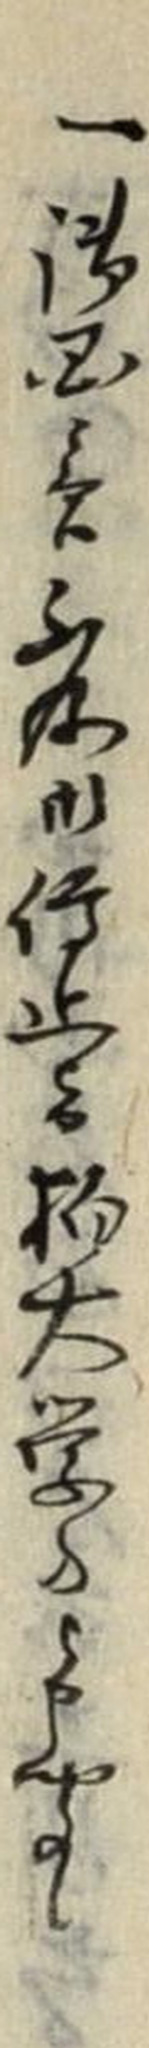一御国にては不及御停止旨狛大学方被申聞候
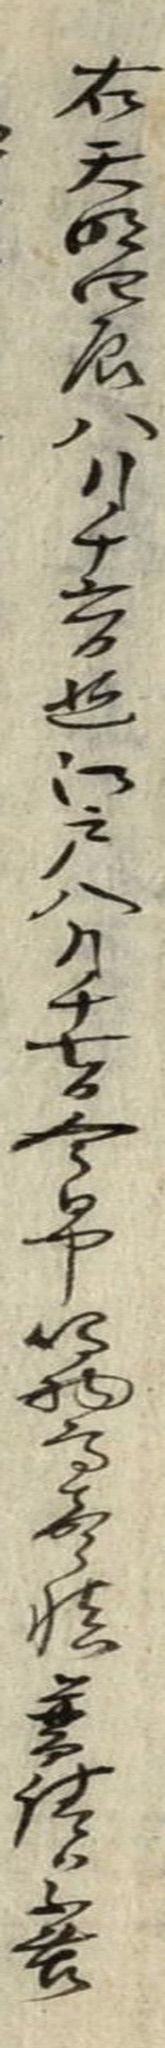右天明四辰八月十六日逝江戸八月十七日今日中鳴物高声慎普請は不苦
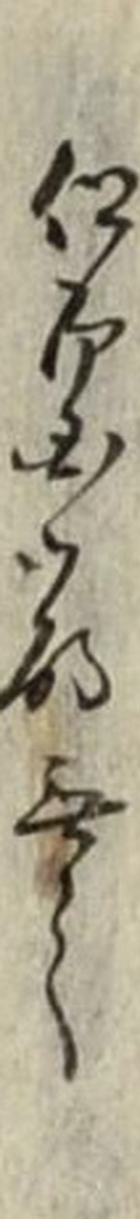但御国御触無之
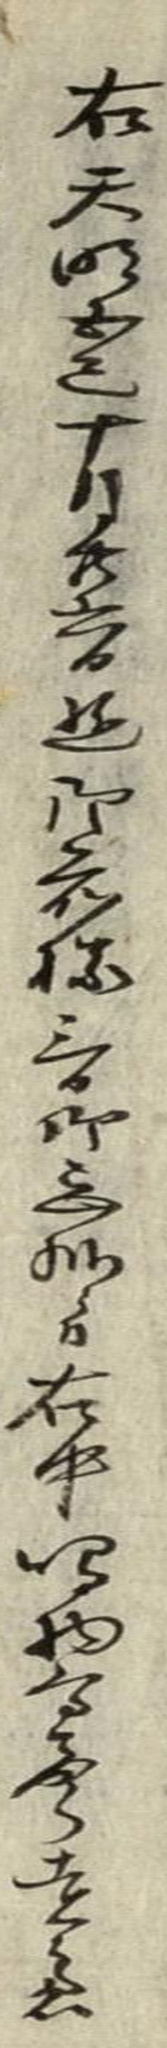右天明五巳十月廿六日逝御前様三日御忌掛に付右中鳴物高声遠慮
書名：御停止異変死失
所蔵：福井県文書館 Fukui Prefectural Archives
